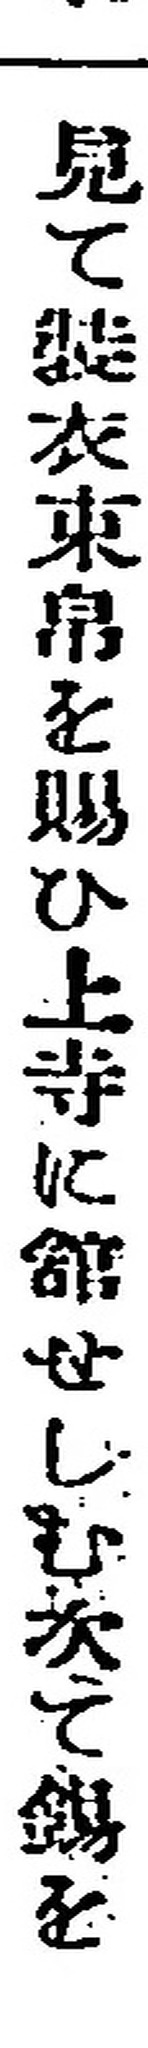見て装衣束帛を賜ひ上寺に舘せしむ次て錫を
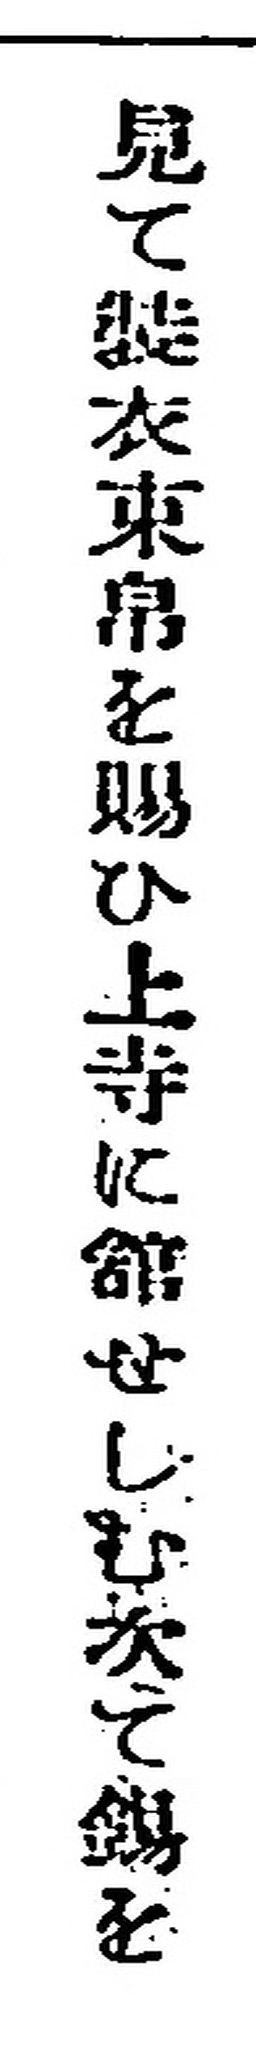見て装衣束帛を賜ひ上寺に舘せしむ次て錫を
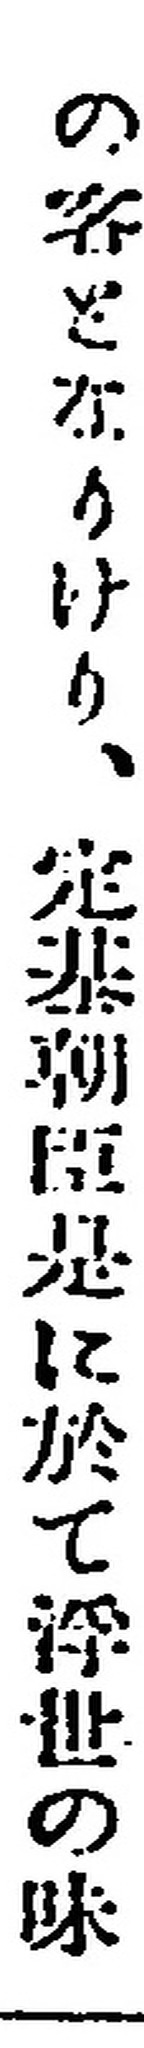の客となりけり、定基朝臣是に於て浮世の味
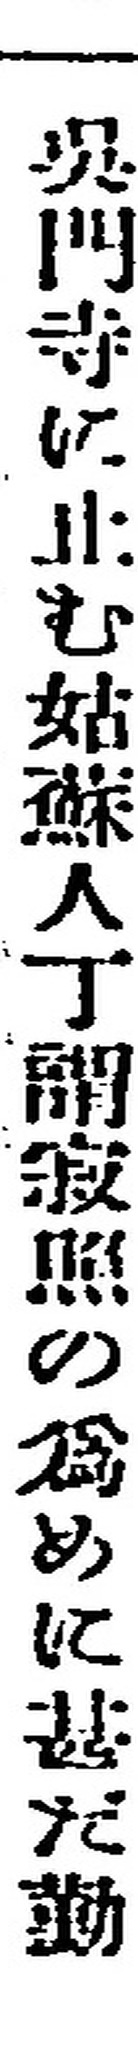呉門寺に止む姑蘇人丁謂寂照の為めに甚だ勤
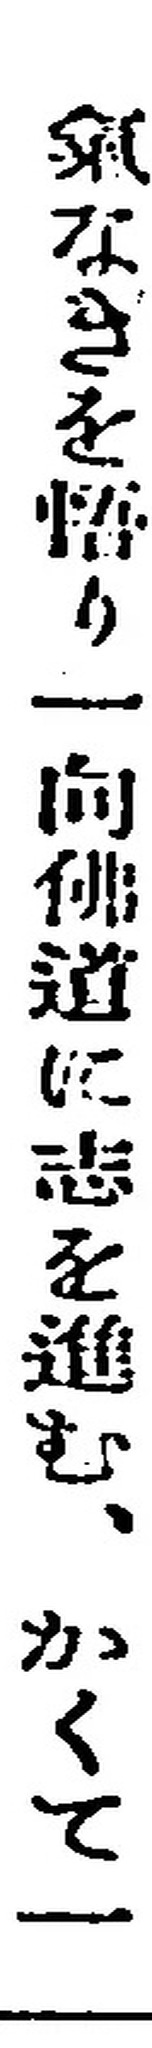気なきを悟り一向仏道に志を進む、かくて一
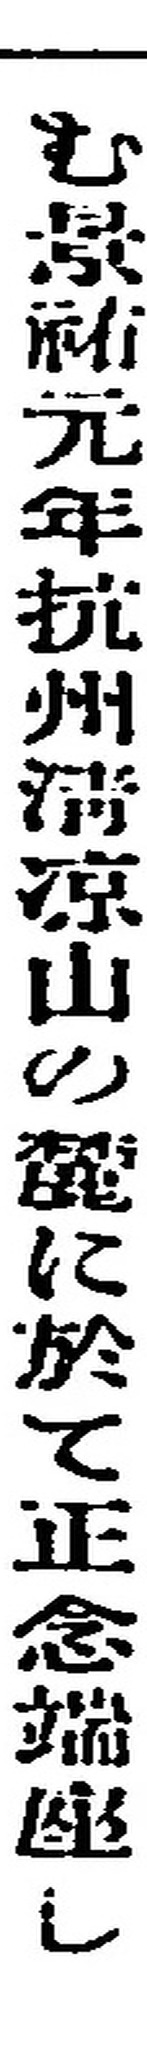む景祐元年抗州清涼山の麓に於て正念端座し
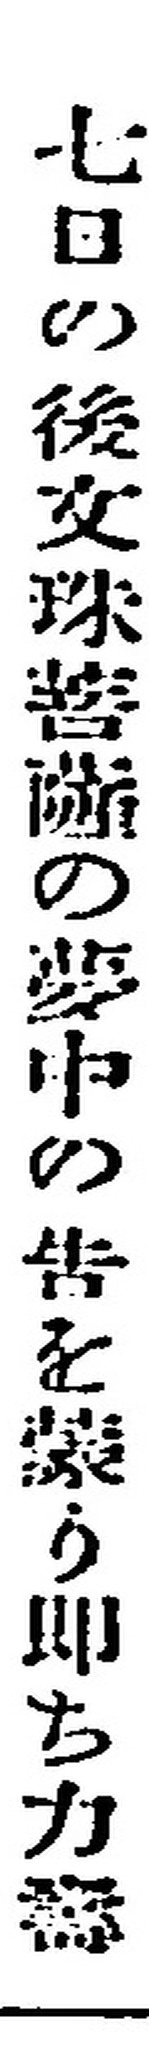七日の後文珠菩薩の夢中の告を蒙り即ち力寿
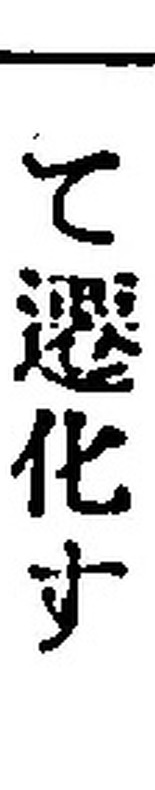て遷化す
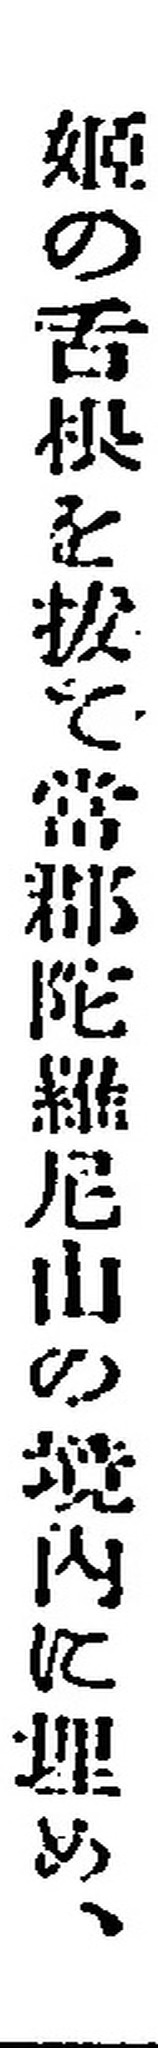姫の舌根を抜て当郡陀羅尼山の境内に埋め、
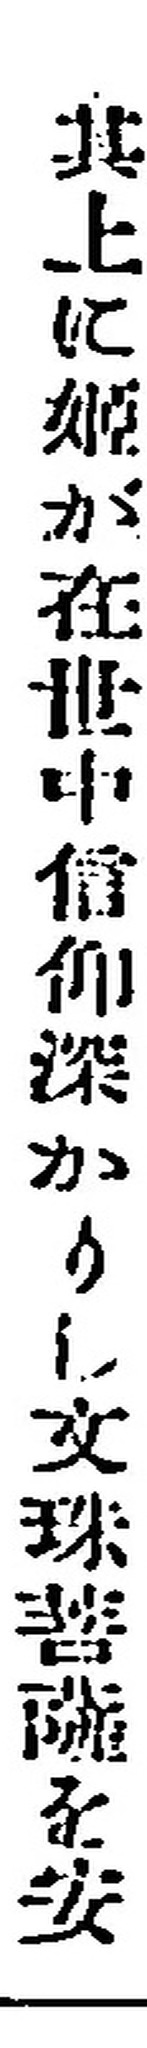其上に姫が在世中信仰深かりし文珠菩薩を安
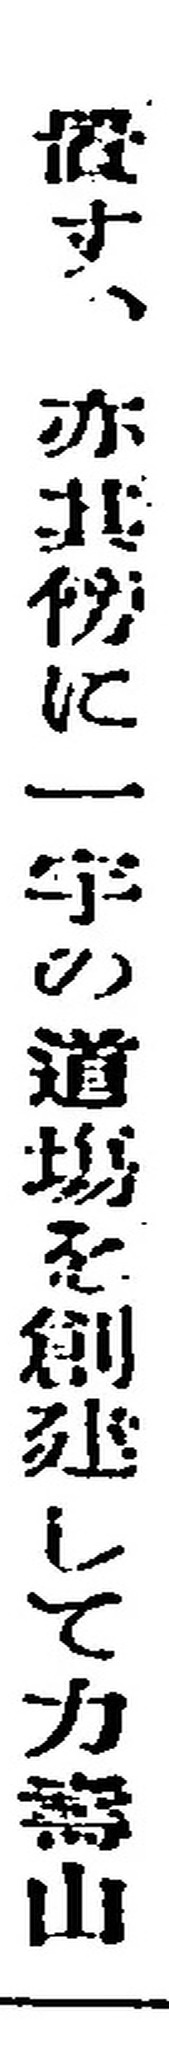置す、亦其傍に一宇の道場を創建して力寿山
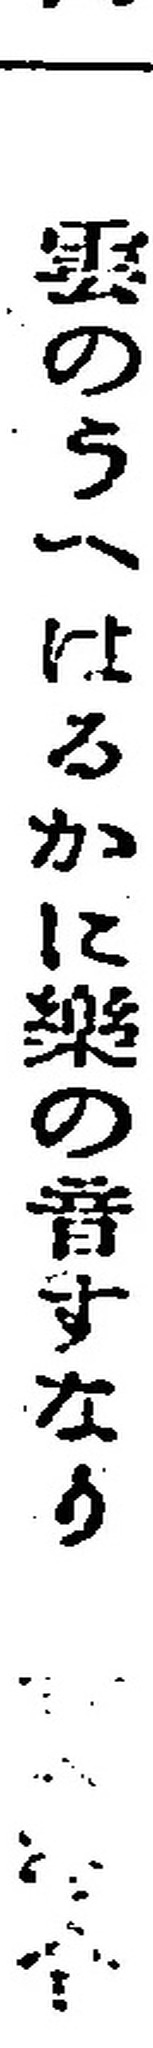雲のうへはるかに楽の音すなり
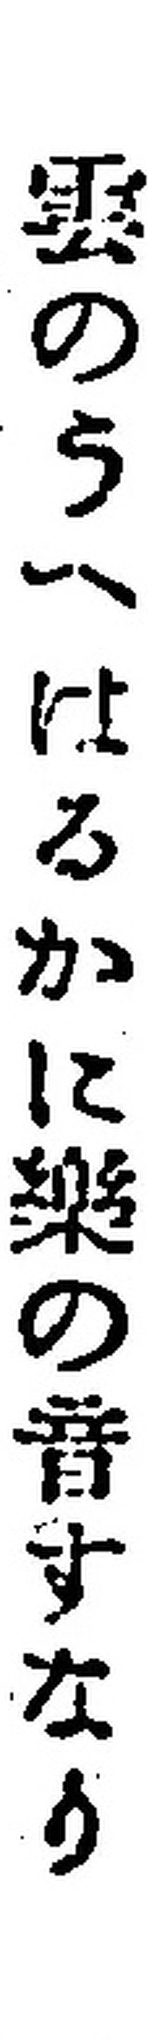雲のうへはるかに楽の音すなり
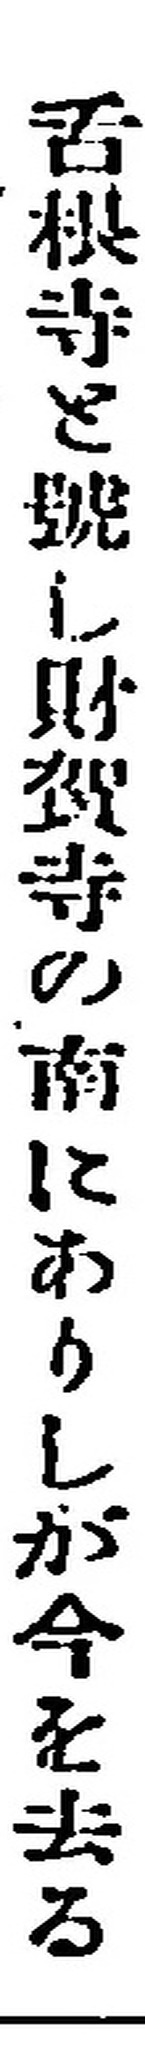舌根寺と号し財賀寺の南にありしが今を去る
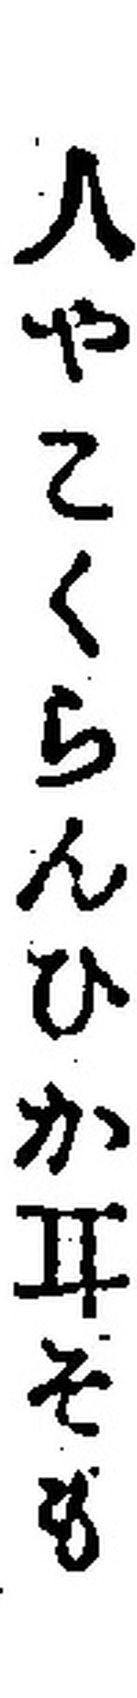人やこくらんひか耳そも
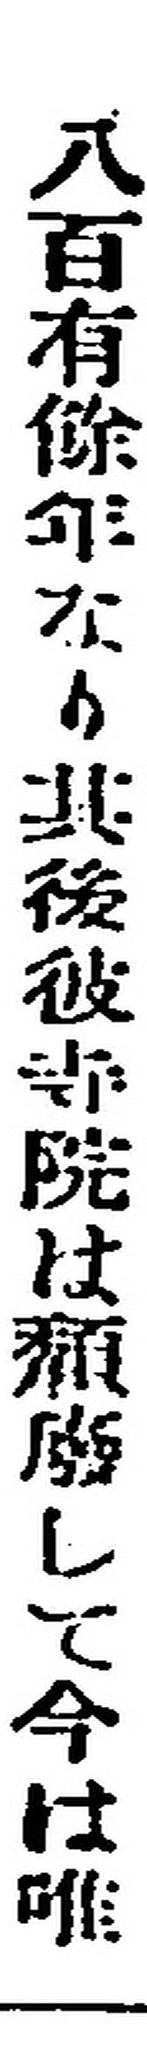八百有余年なり其後彼寺院は頽廃して今は唯
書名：東参名勝案内
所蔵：国立国会図書館 National Diet Library, JAPAN
